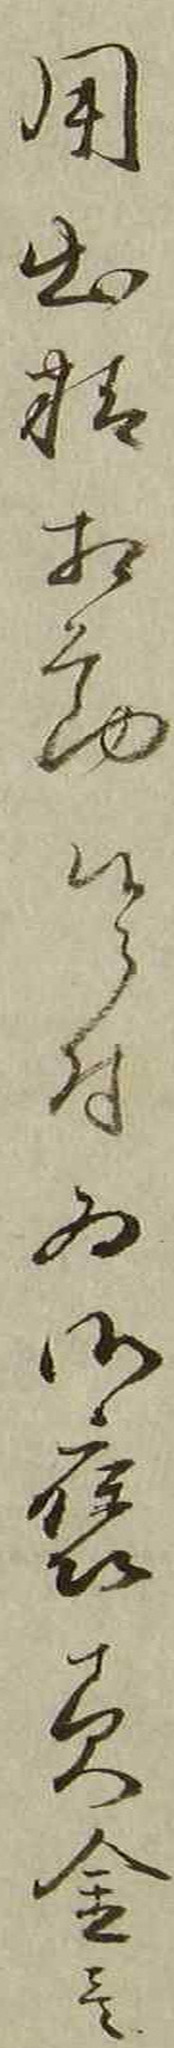用出精相勤候ニ付為御褒美金壱
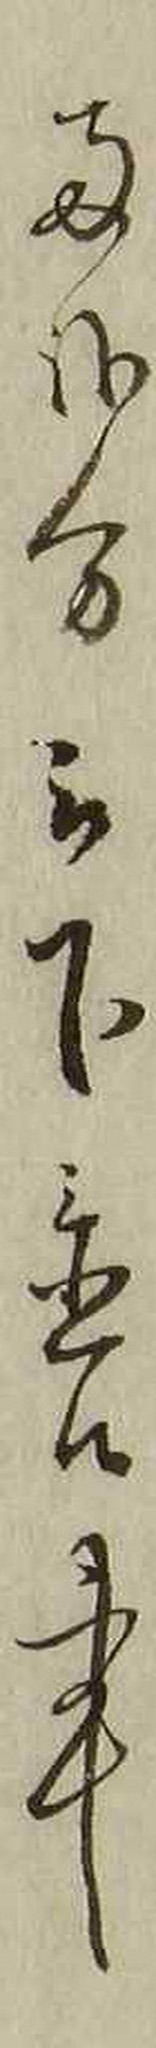両弐分被下置候事
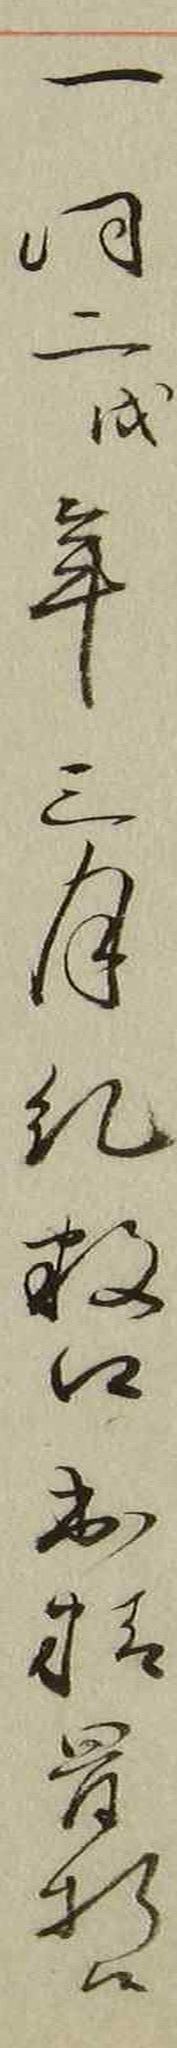一同二戌年三月糺数口出精骨折候
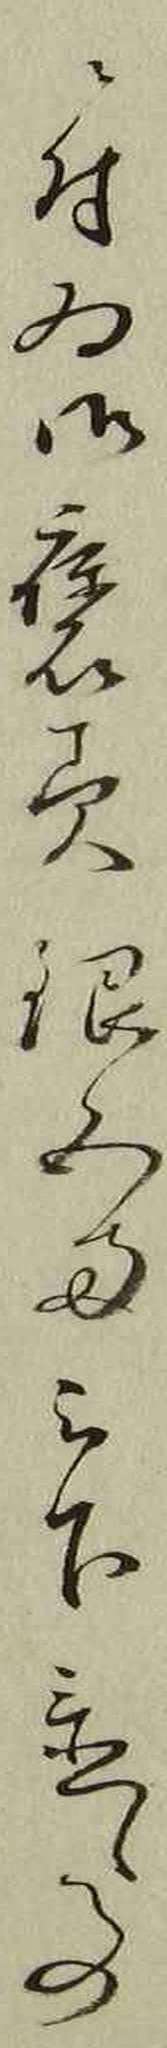ニ付為御褒美銀五両被下置候事
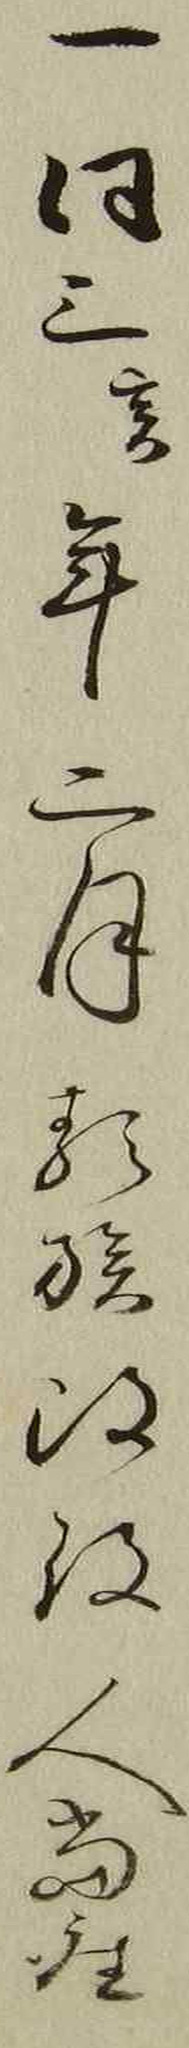一同三亥年二月類族改役人当座
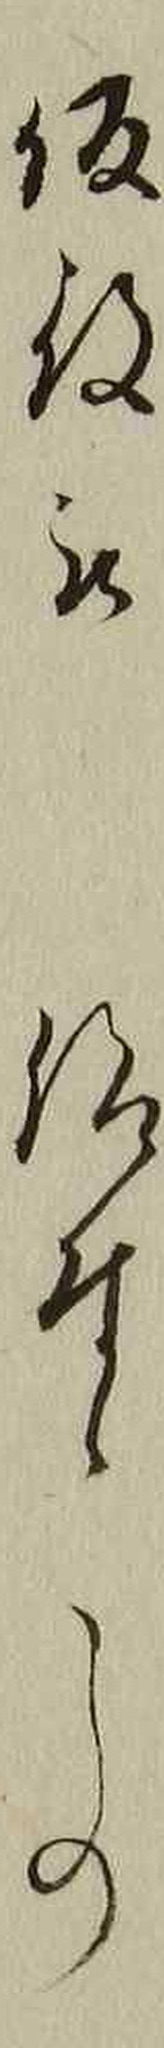仮役被仰付候事
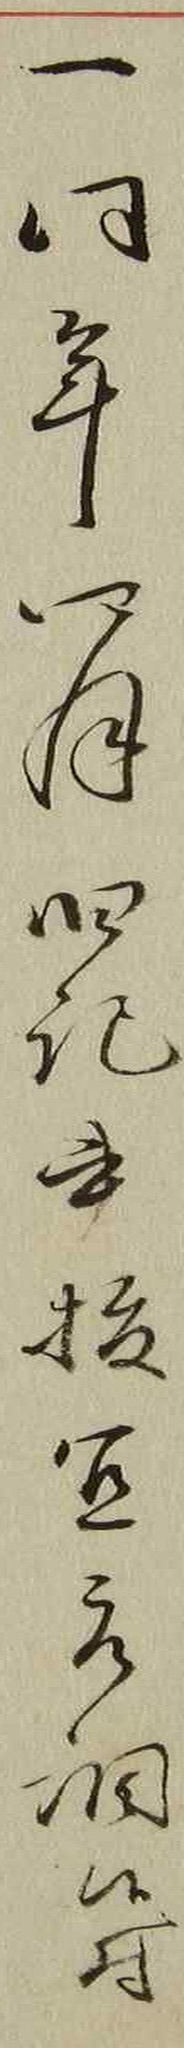一同年四月旧記書抜宜取調候ニ付
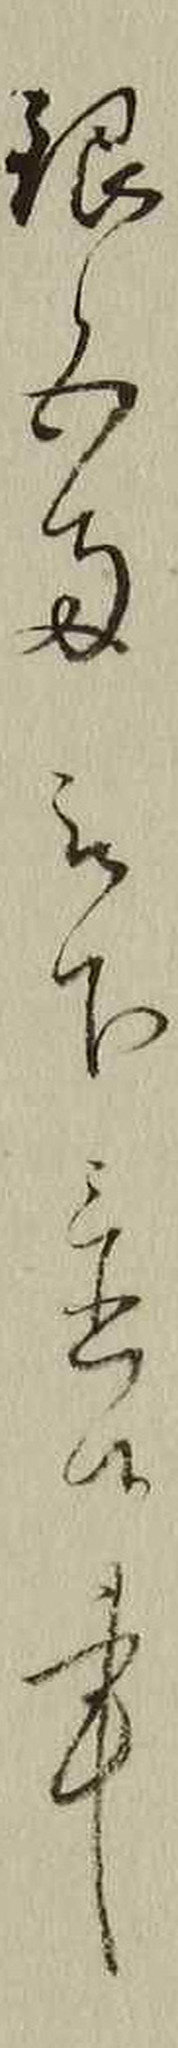銀五両被下置候事
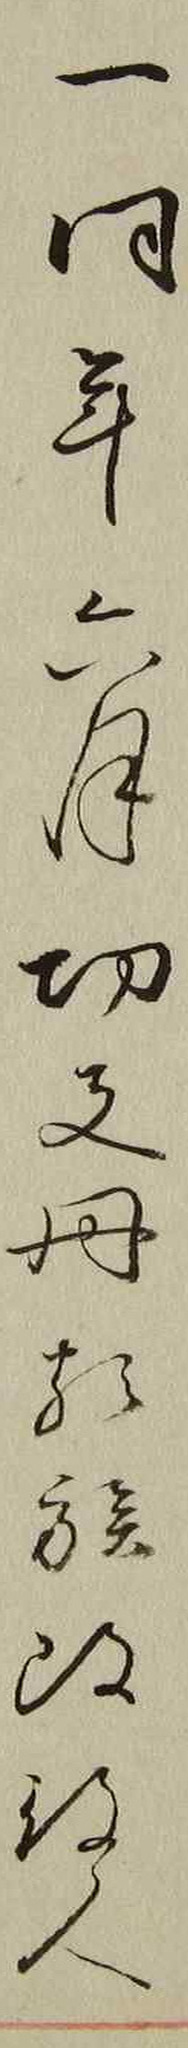一同年六月切又丹類旅改役人
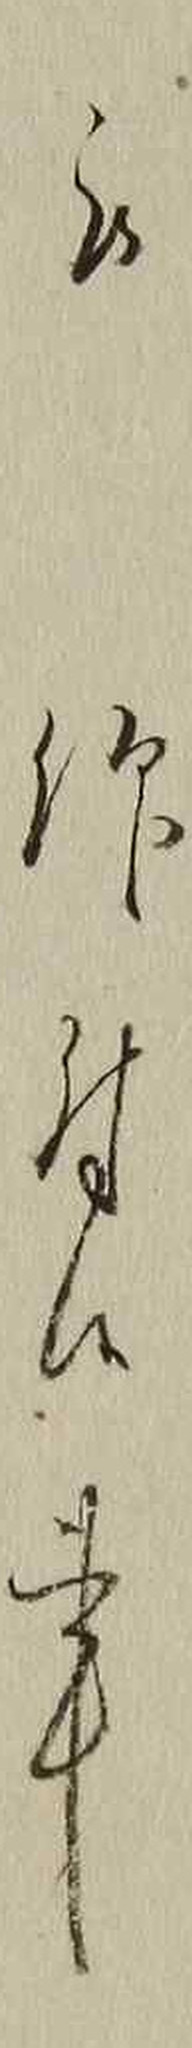被仰付候事
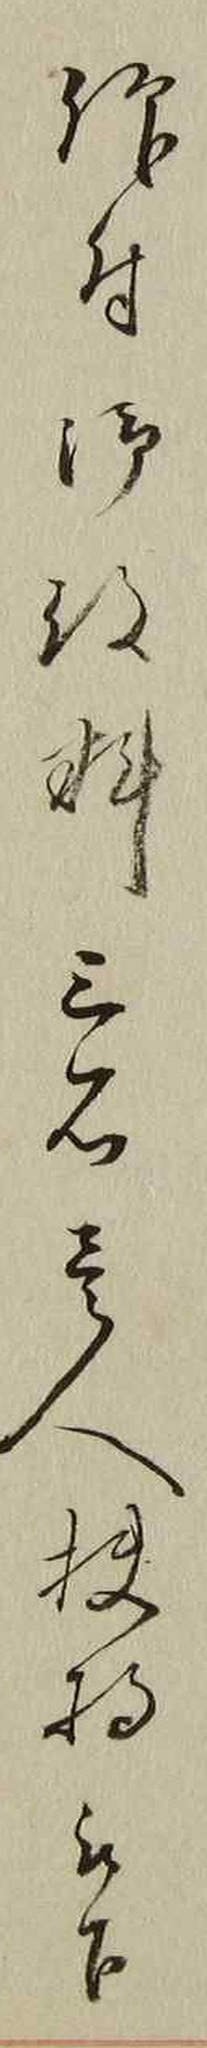仰付御役料三石壱人扶持被下
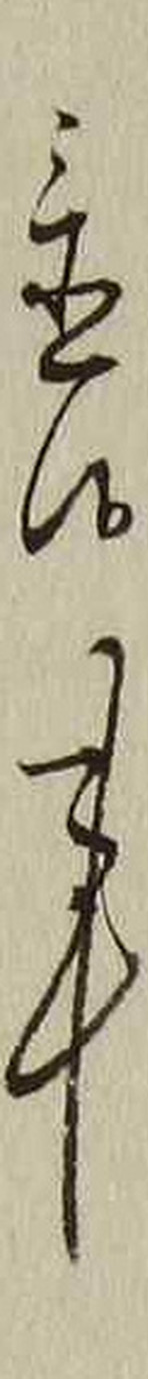置候事
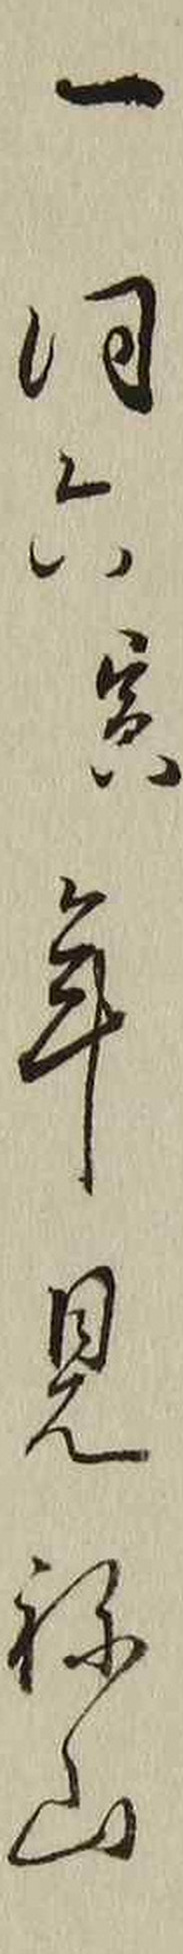一同六寅年見祢山
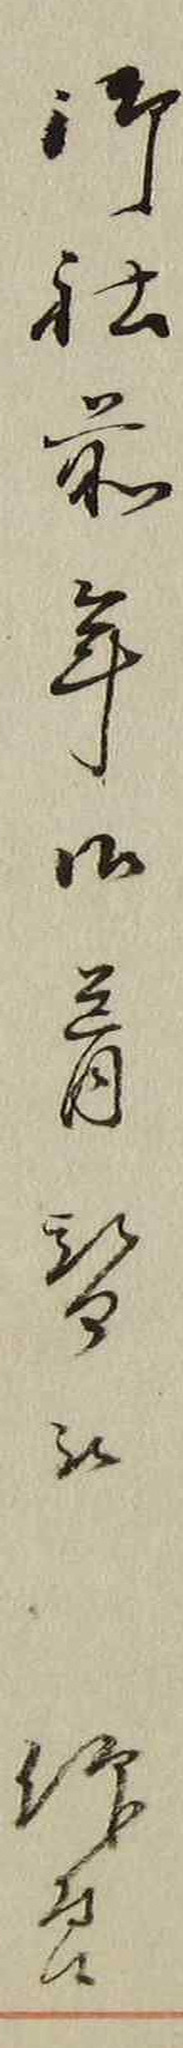御社前年御葺替被仰付候
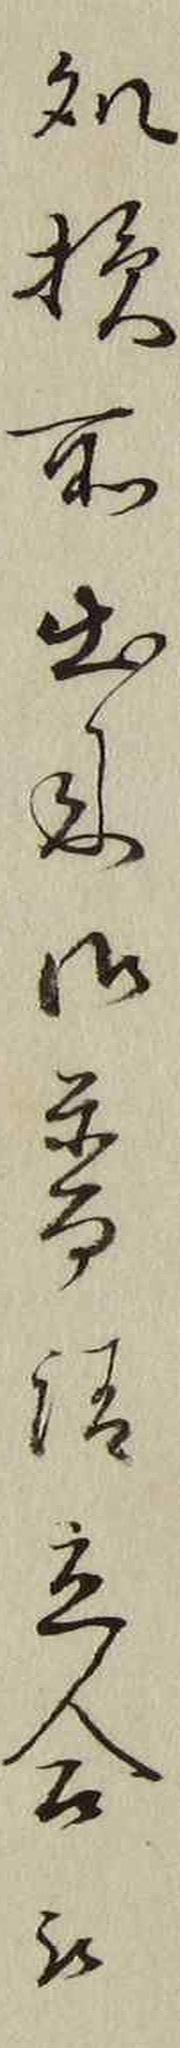処損所出来御普請立合被
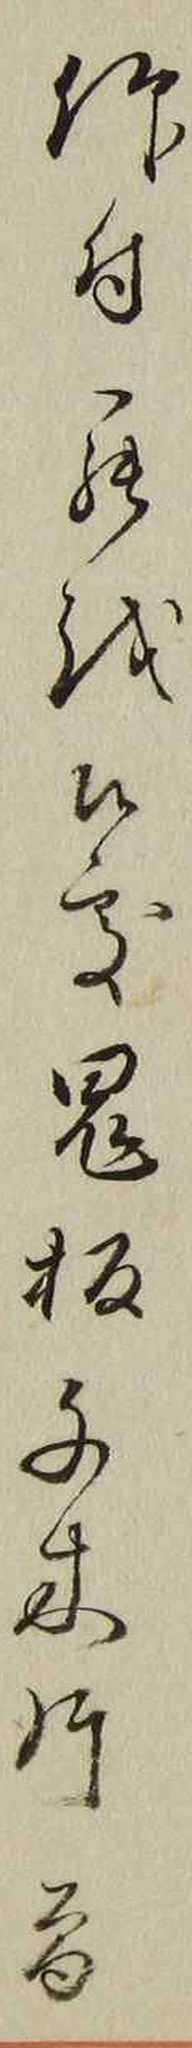仰付罷越候処鬼板千木片曾
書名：諸士系譜　巻之8　い之部8
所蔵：会津若松市立会津図書館
